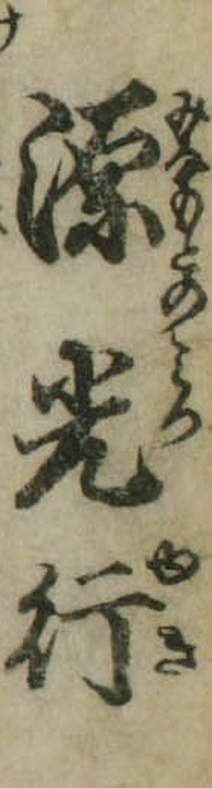源光行
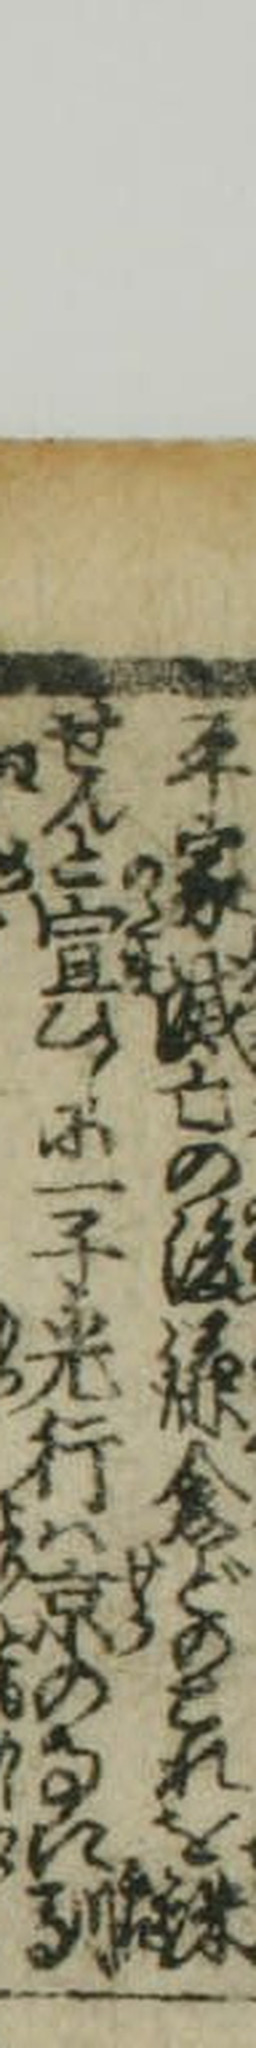せんと宣ひしに一子光行は京の事に馴
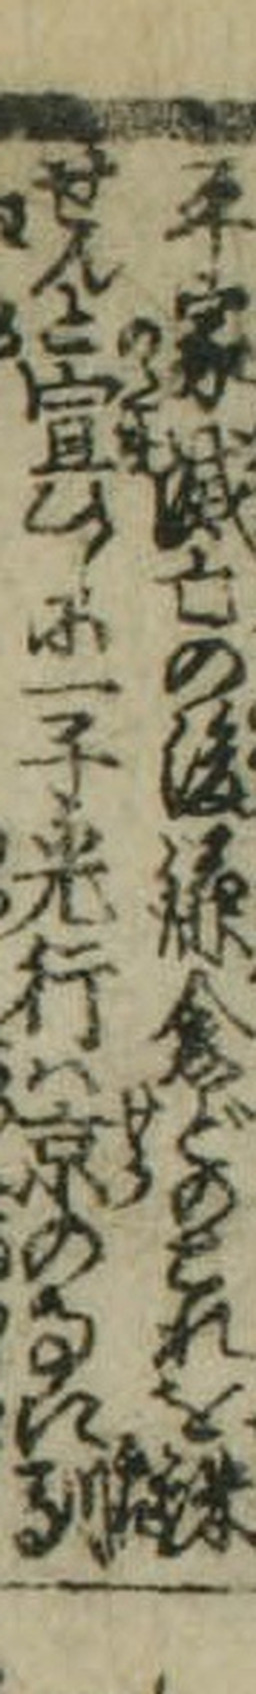せんと宣ひしに一子光行は京の事に馴
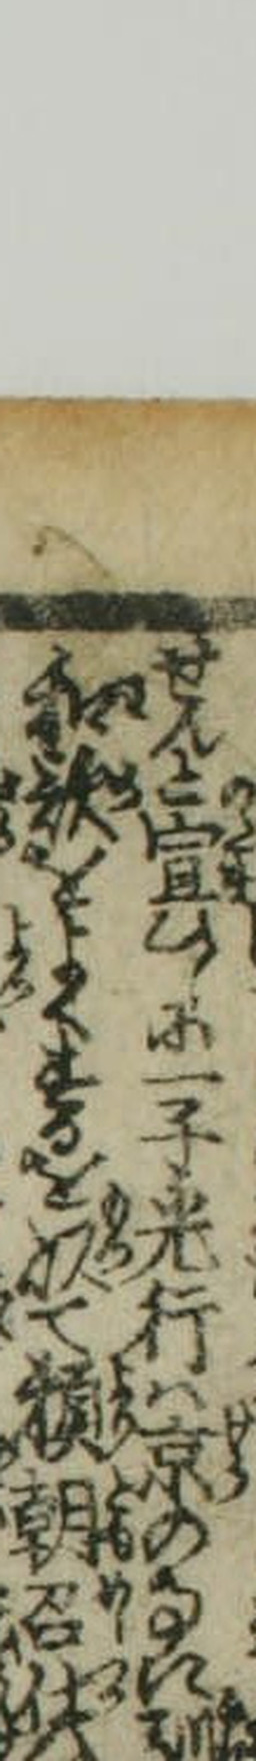和歌をよくするを以て頼朝召仕ひ
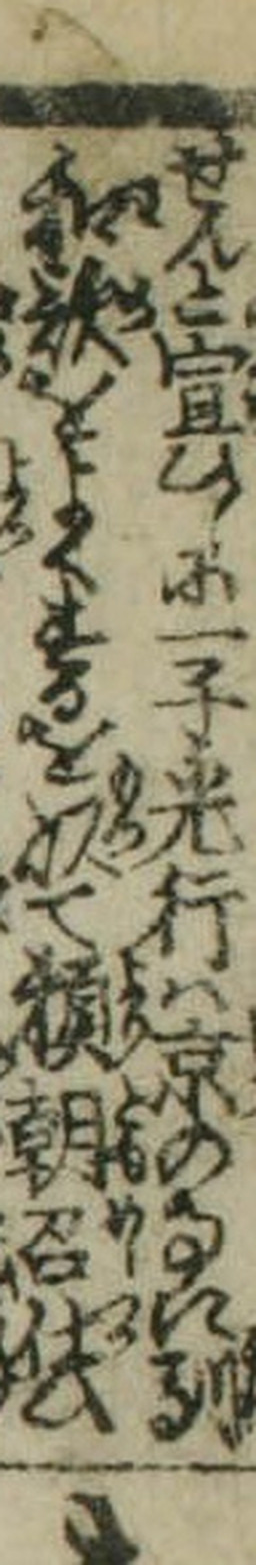和歌をよくするを以て頼朝召仕ひ
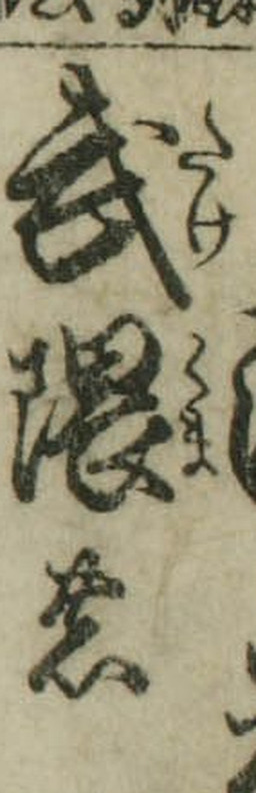武隈の
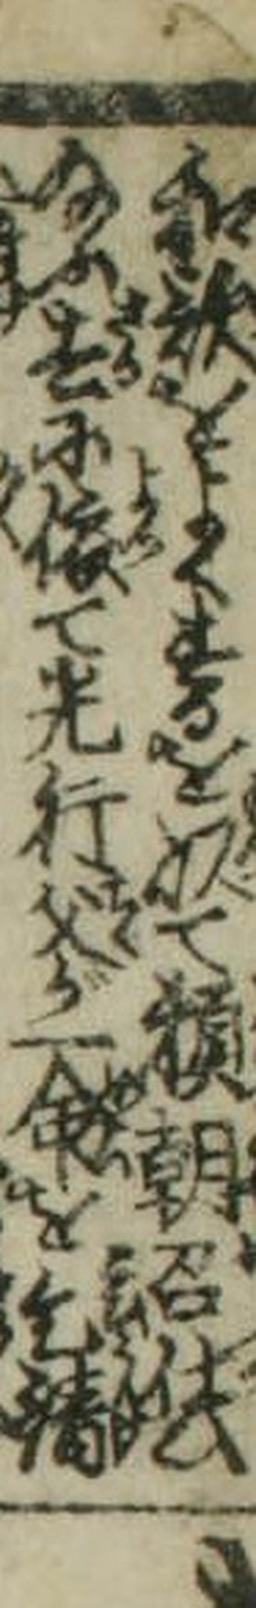給ふ去に依て光行父が一命を乞請
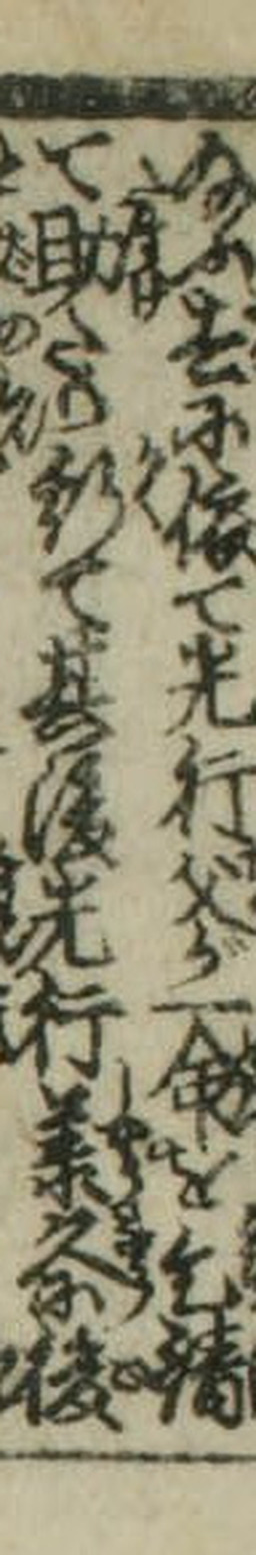て助たり斯て其後光行承久に後
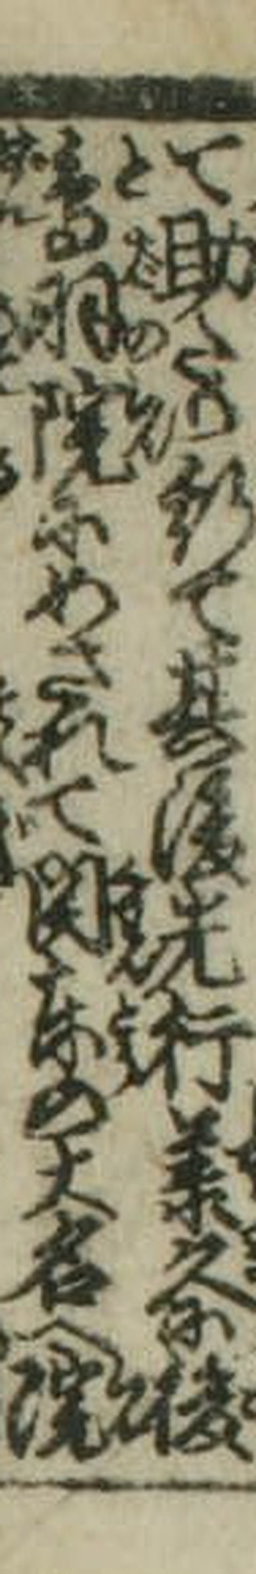鳥羽院にめされて関東の大名へ院
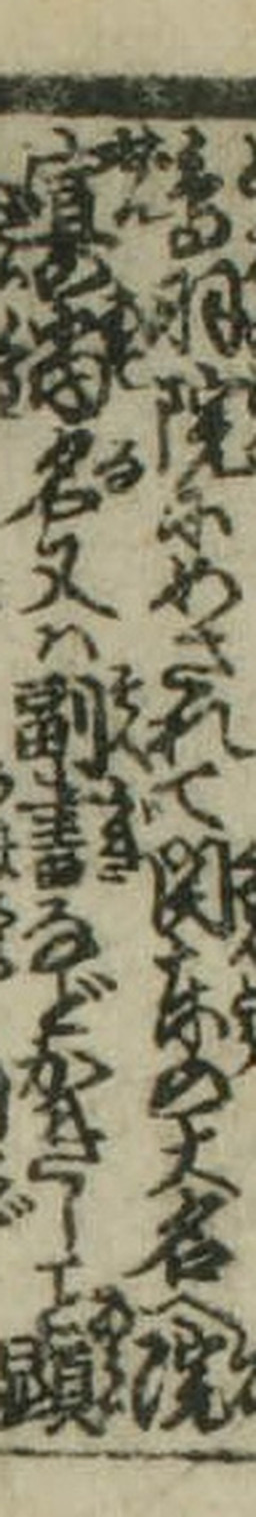宣の当名又は副書などかきしこと顕
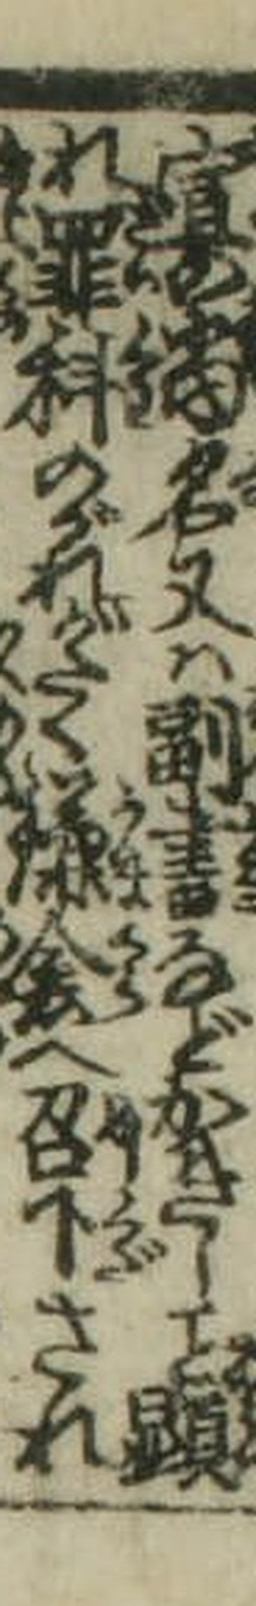れ罪科のがれがたく鎌倉へ召下され
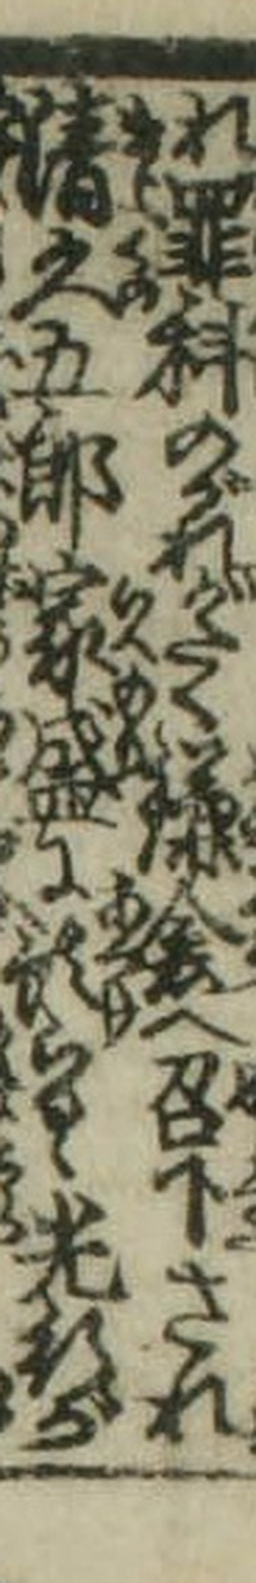清久五郎家盛に預らるゝ光行が
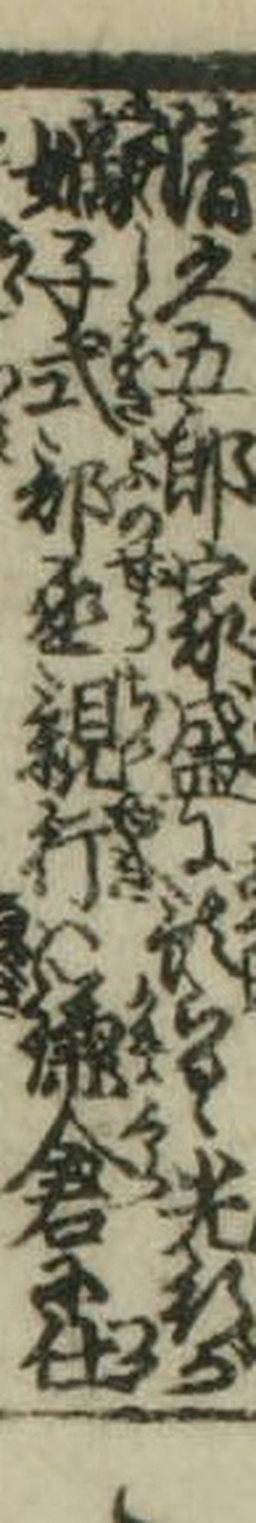嫡子式部丞親行は鎌倉に仕
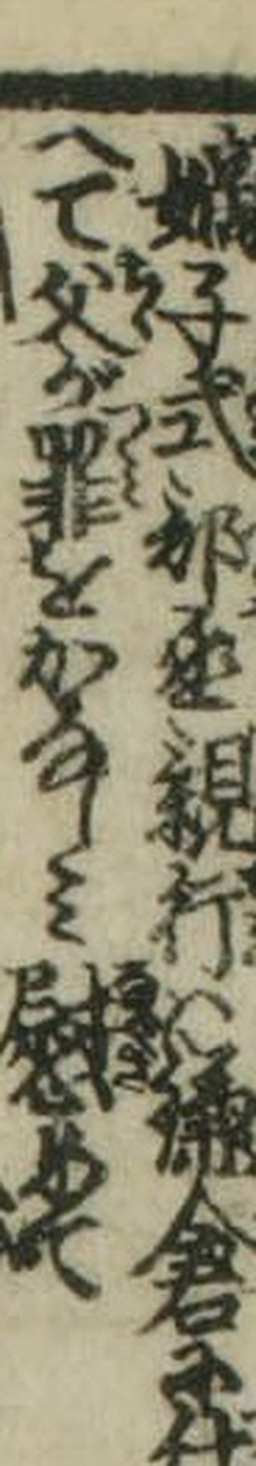へて父が罪をかなしみ慰めて
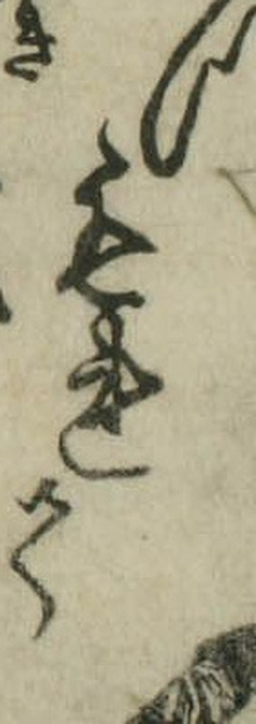もれて
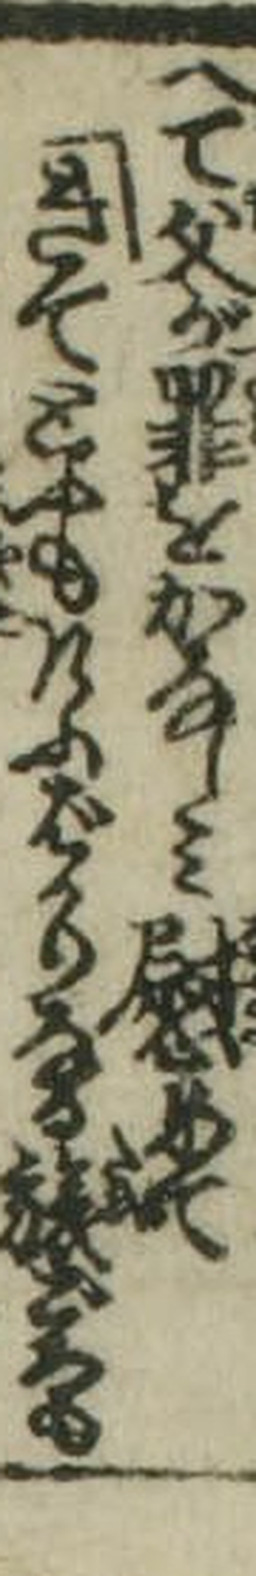〽きてとふもけふばかりなる旅ごろも
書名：續英雄百人一首
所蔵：東京学芸大学附属図書館
